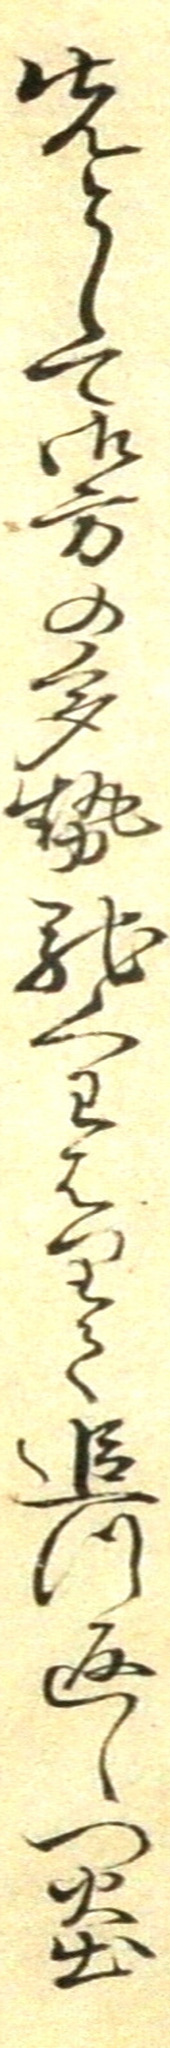先として御方の多勢馳くわはりて追つ返しつ火出
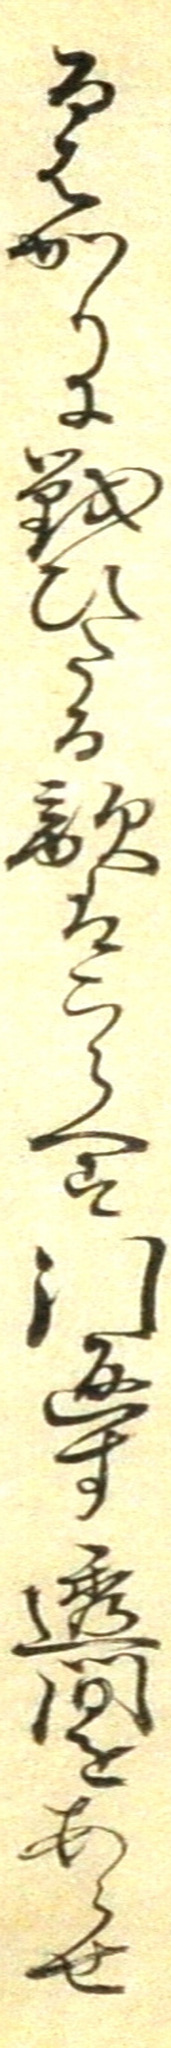るはかりに戦ひたる敵はこらへす引返す透間をあらせ
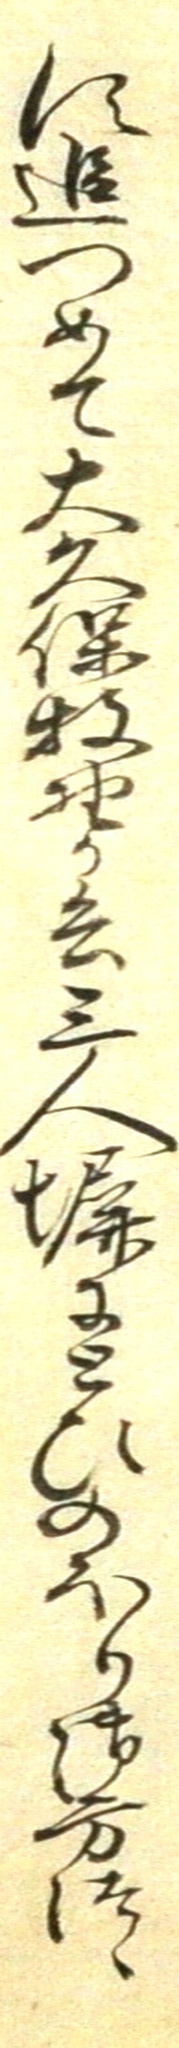す追つめて大久保牧野か兵三人塀にとひのほり御方つゝ
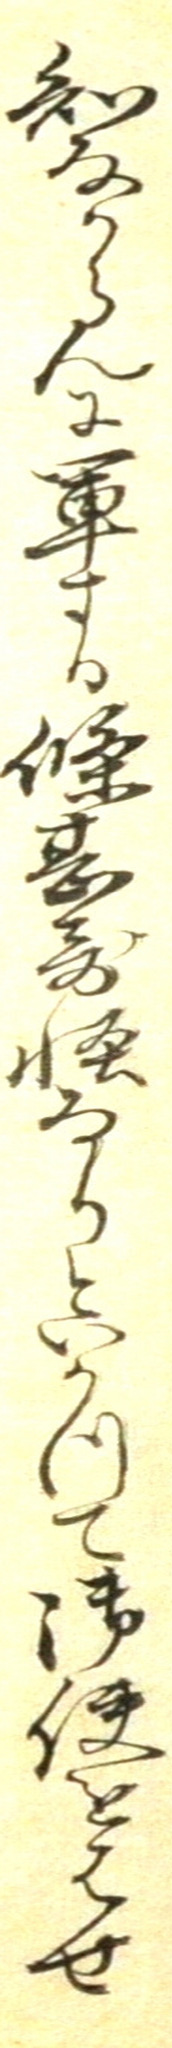知なからんに軍する条甚奇怪なりといかつて御使をはせ
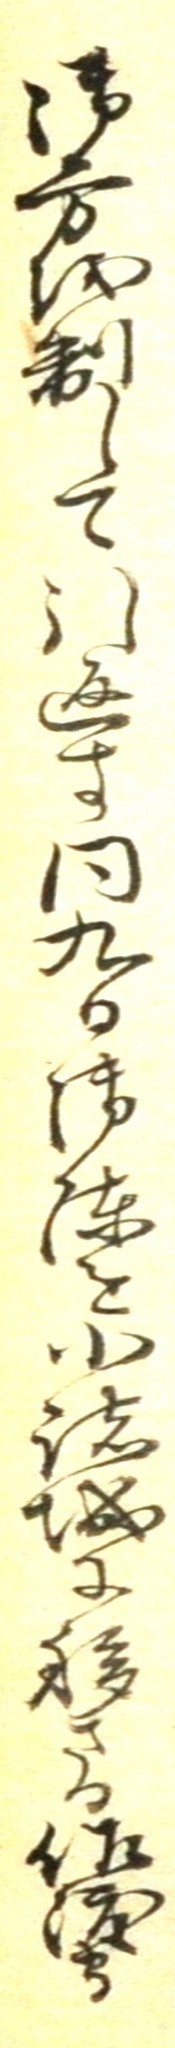御方を制して引返す同九日御陣を小諸城に移さる佐渡守
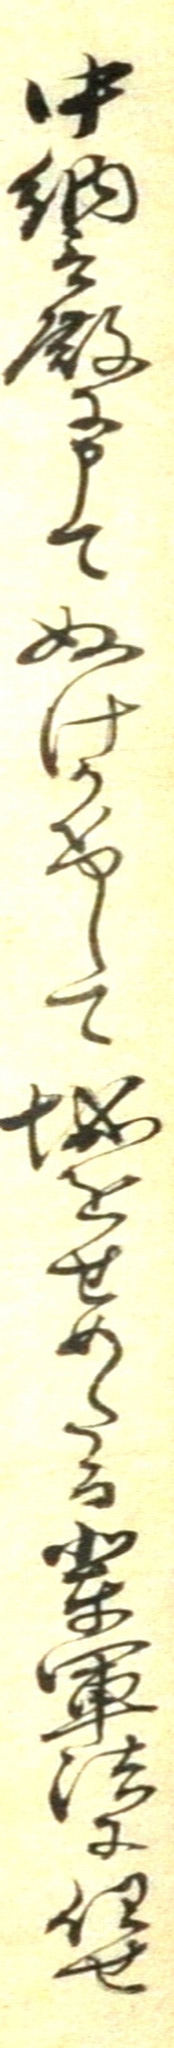中納言殿に申てぬけかけして城をせめたる輩軍法に任せ
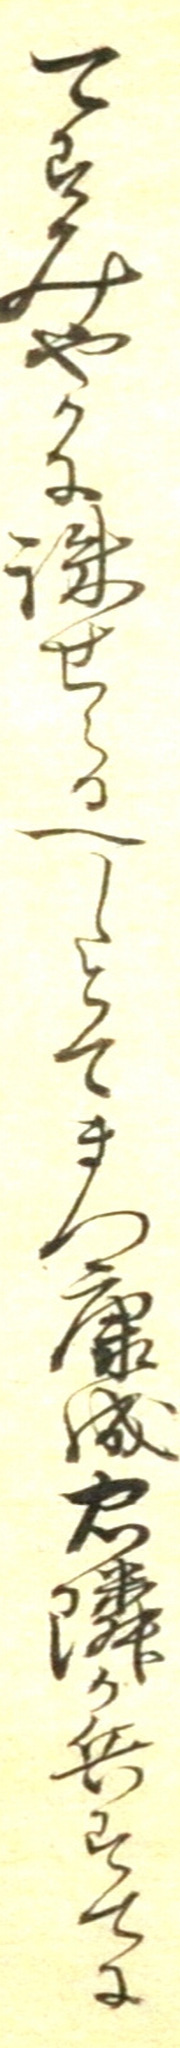てすみやかに誅せらるへしとてまつ康成忠隣か兵すてに
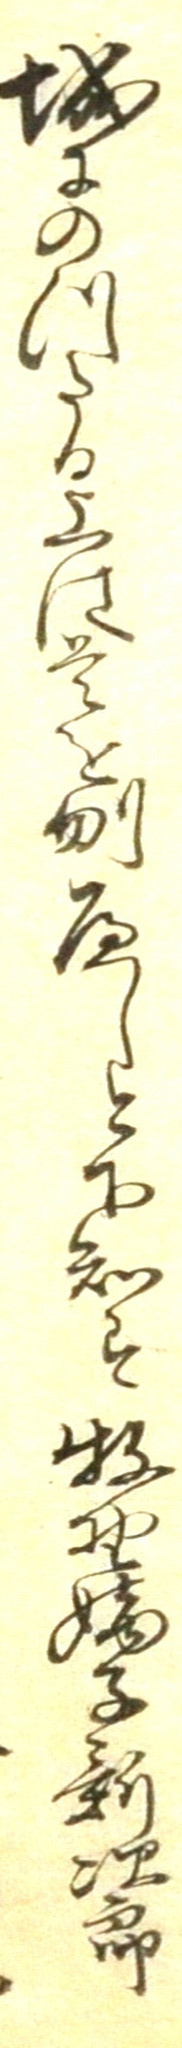城にのつたる上は首を刎へしと下知す牧野嫡子新次郎
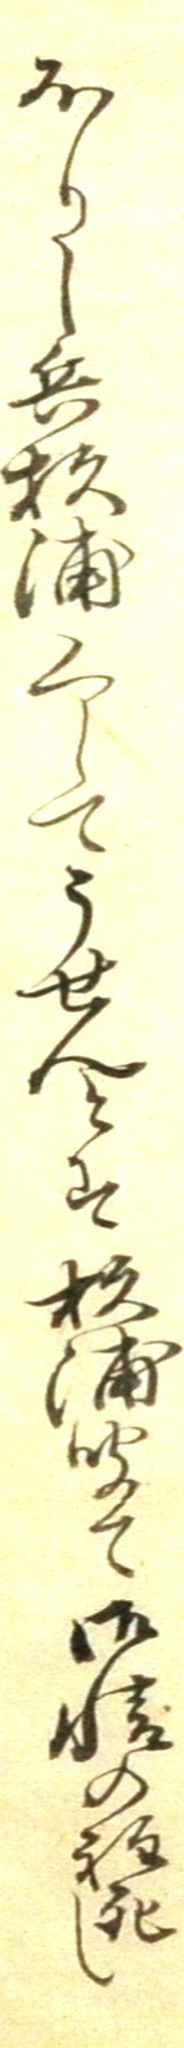ほりし兵杉浦くしてうせんとす杉浦聞て御情の程死し
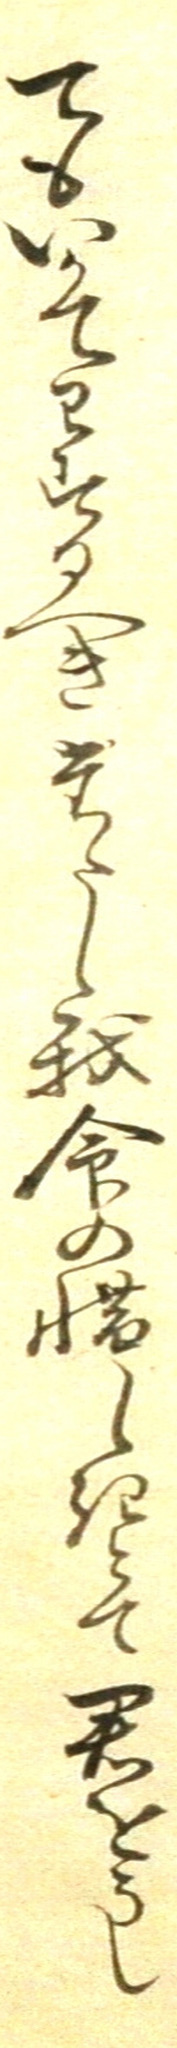てもいかてわするへきたゝし我命の惜しきとて君をうし
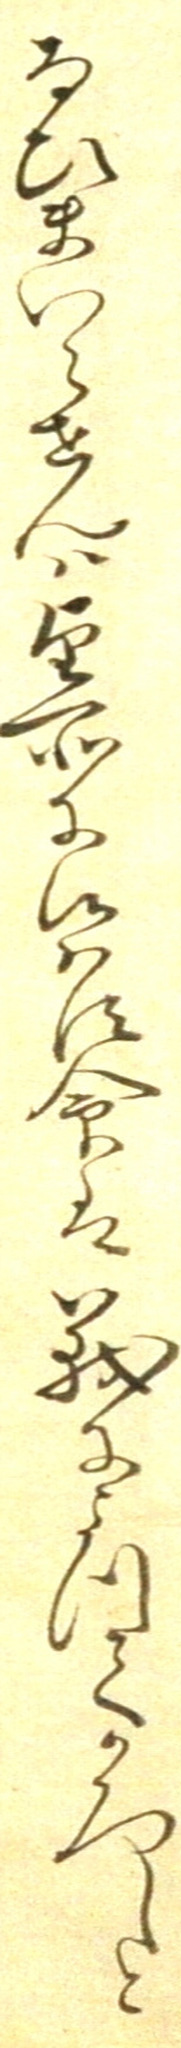なひまいらせんは望所に候はす命は義によつてかろしと
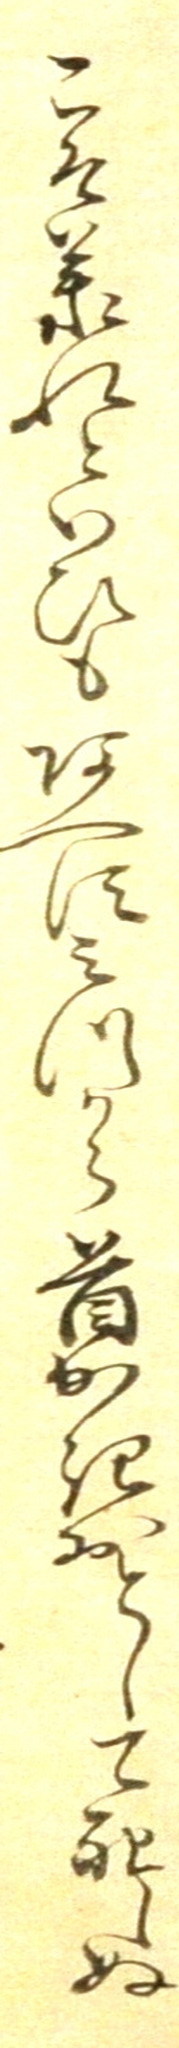こそ承れといひもあへすみつから首かきおとして死しぬ
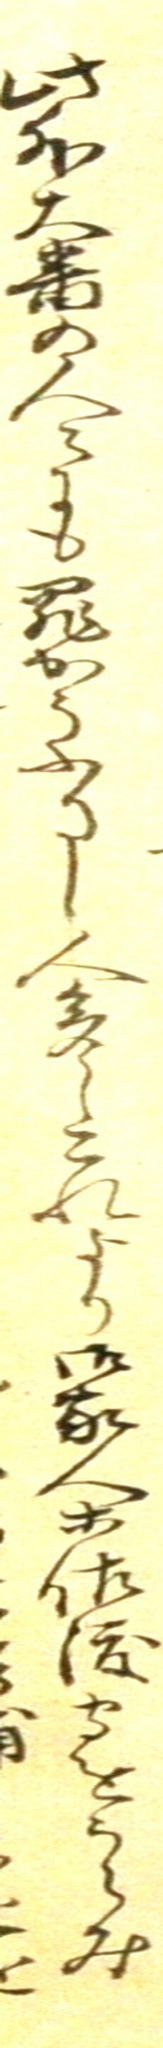此外大番の人々にも罪かうふりし人多しこれより御家人等佐渡守をうらみ
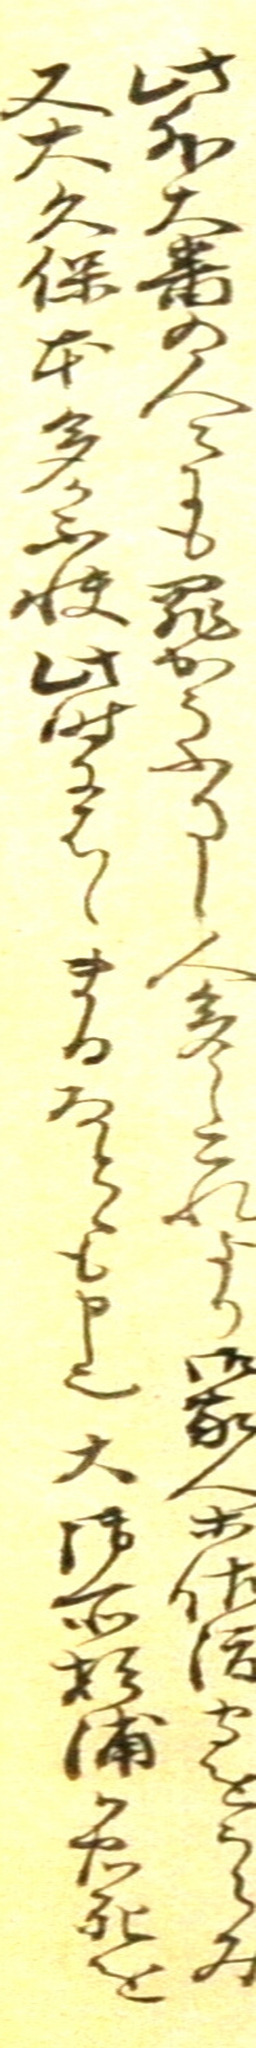又大久保本多か不快此時にはしまるなとゝも申也大御所杉浦か忠死を

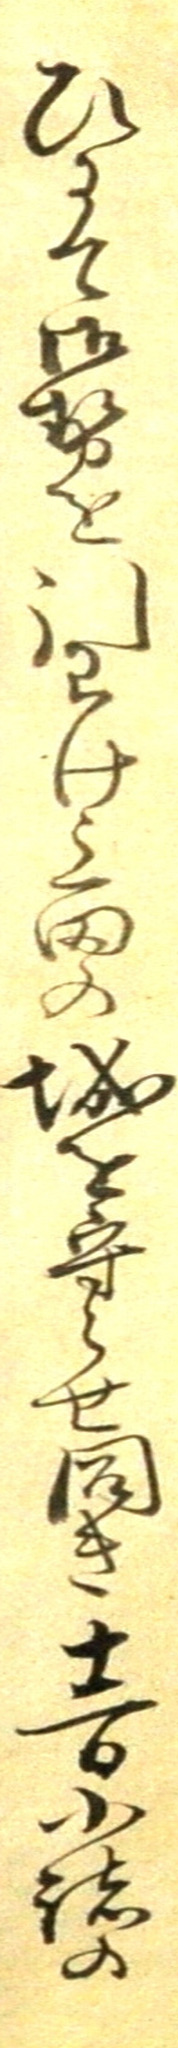ひにて御勢を引わけ上田の城を守らせ同き十二日小諸の
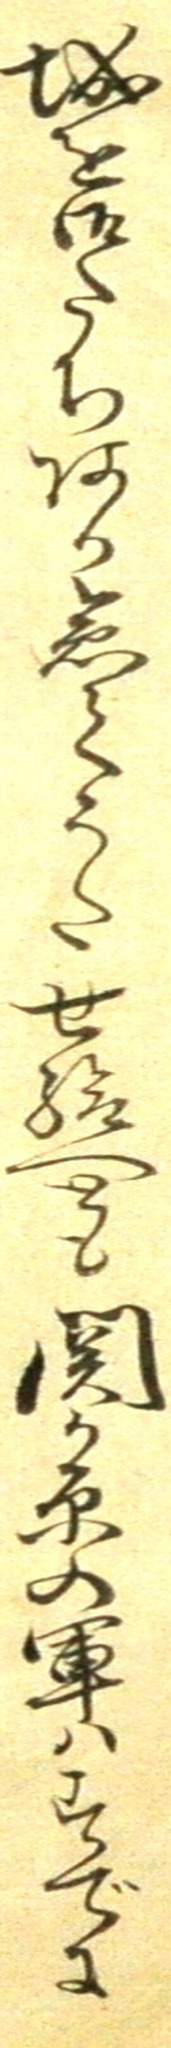城を御たちあり急てうたせ給へともせき関か原の軍はすでに
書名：藩翰譜（四・中）
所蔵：伊那市立高遠町図書館・合同会社AMANE
